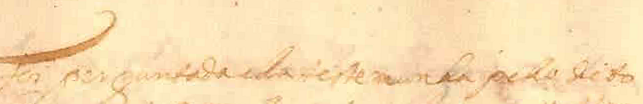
Foi perguntada ela testemunha pello dito
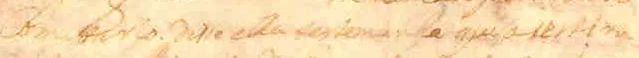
Comisario. disse ella testemunha que asestira
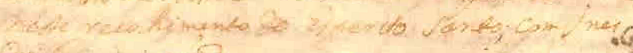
neste recolhimento do Esperito Santo, com Jnes
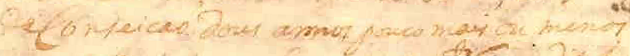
da Conseiçaõ dous annos pouco mais ou menos
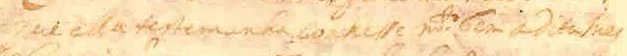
que ella testemunha conhesse m.to bem a dita Ines
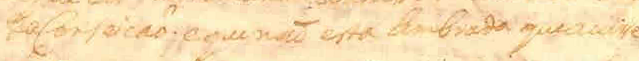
da Conseiçaõ, e que naõ esta lembrada que a uisse
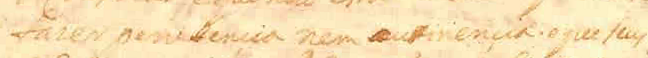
fazer penitencia, nem austinencia. o que seus
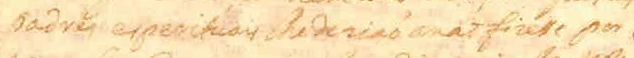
padres esperituais lhe deziaõ a naõ fizesse por
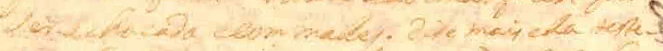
ser achacada, e com malles. dise mais ella teste
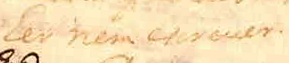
ler nem escreuer.
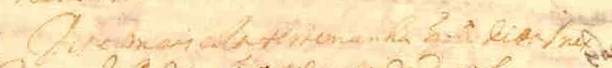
Dise mais ella testemunha q̄ â dita Ines
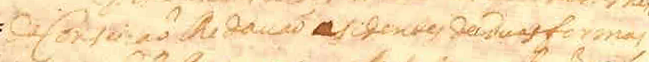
da Conseiçaõ lhe dauaõ asidenttes de duas formas
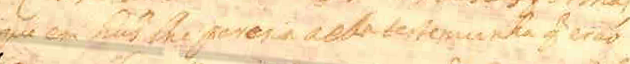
que em hus̄ lhe paresia a ella testemunha q̄ eraõ
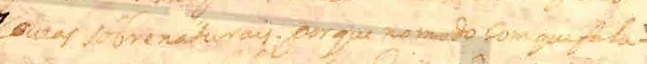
couzas sobrenaturais. porque no modo com que fala
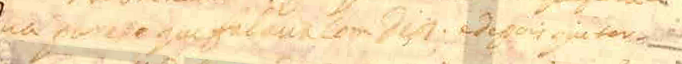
ua paresia que falaua com Deos; e depois que tor
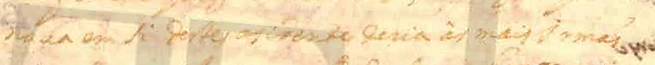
naua em si destes asidente dezia âs mais Irmās
